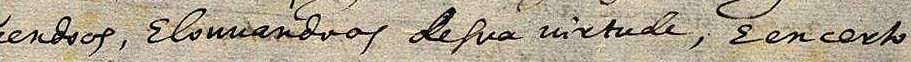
cendoos, E louuandoos de sua uirtude, E en certo
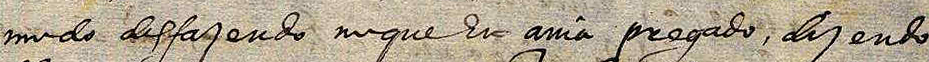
modo desfazendo no que Eu auia pregado, dizendo
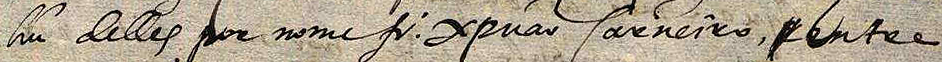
hū delles por nome fr. Xpuão Carneiro, e entre
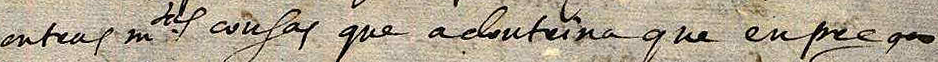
outras mtas. cousas que a doutrina que enprega
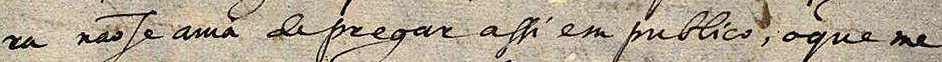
ra não se auia de pregar assi em publico, o que me
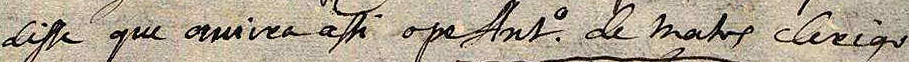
disse que ouuira assi o pe Anto. de matos clerigo
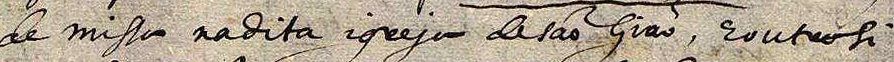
de missa na dita igreja de saõ Giaõ, E outrosi
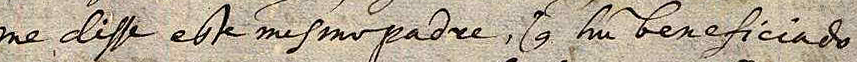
me disse este mesmo padre, q̄ hū beneficiado
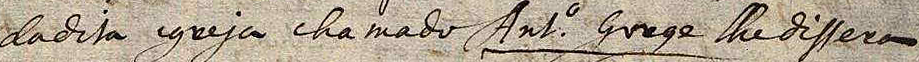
da dita igreja chamado Ant.o Gorge lhe dissera
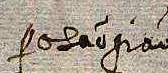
Ꝑo saõ giaõ
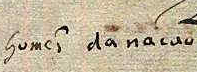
homes̄ da nacaõ
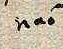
naõ
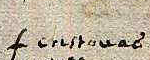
f cristouaõ
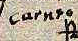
carnro
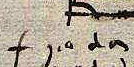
f po da
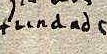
trindade
